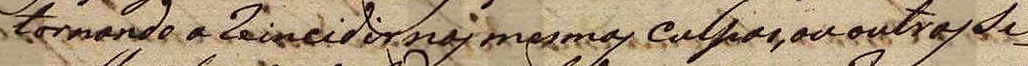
tornando a Reincidir nas mesmas culpas, ou a outras si
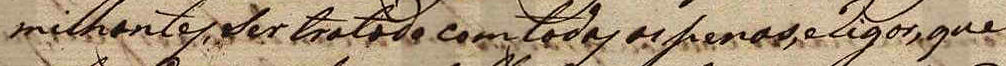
milhantes, ser tratado com todas as penas, e Rigor, que
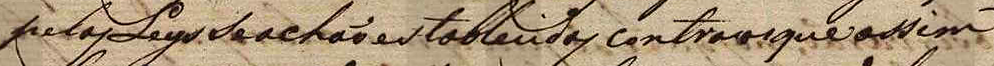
pelas Leys se achaõ establecidas contra os que assim
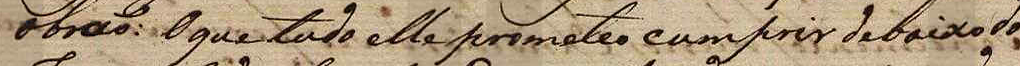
obraõ: O que tudo elle prometeo cumprir debaixo do
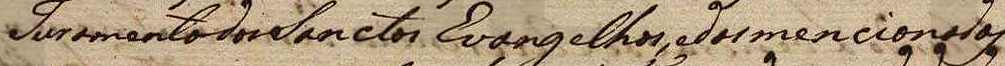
Iuramento dos Sactos Evangelhos, e das mencionadas
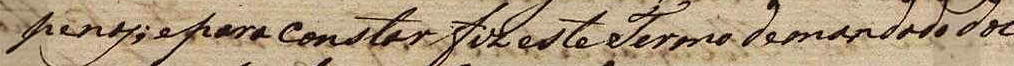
penas; e para constar fiz este Termo de mandado dos
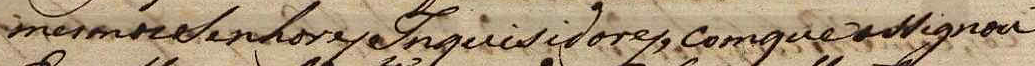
mesmos Senhores Inquisidores, com que assignou.
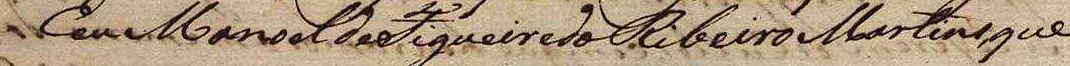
E eu Manoel de Figueiredo Ribeiro Martins, que
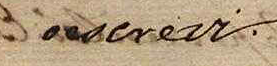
o escrevi.
